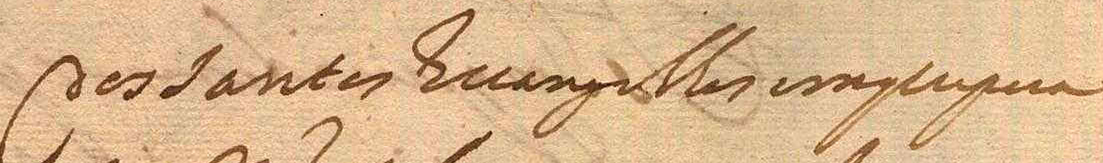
dos santos Euangelhos em que pos
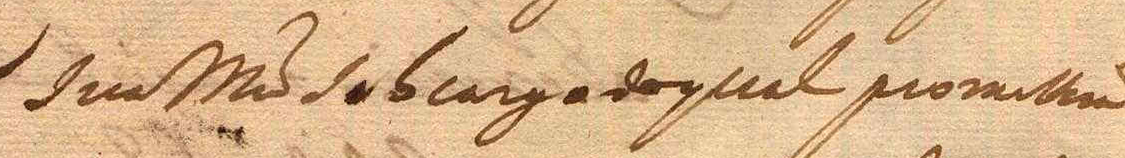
sua maõ sob cargo do qual prometterā
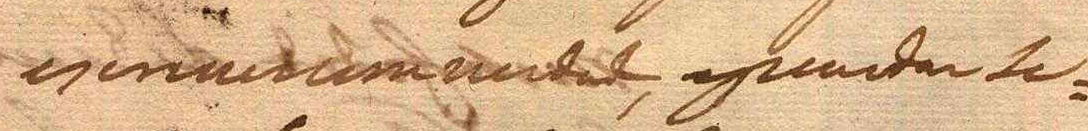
escreuer com uerdade, e guardar se
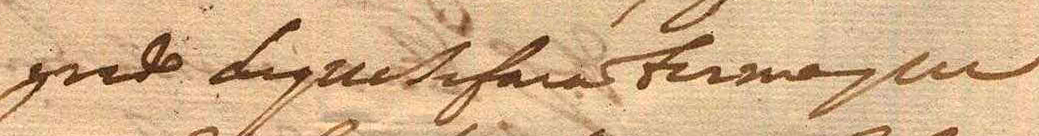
gredo do qual faraõ termo que
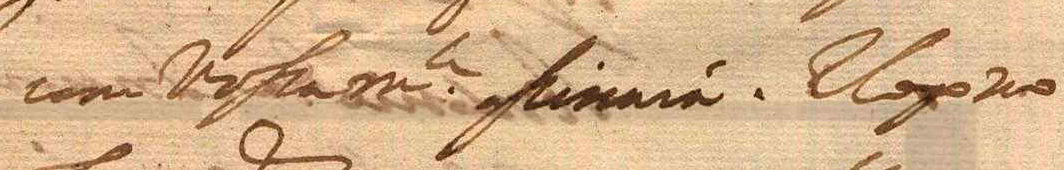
com Vossa m.ce assinará. E logo no
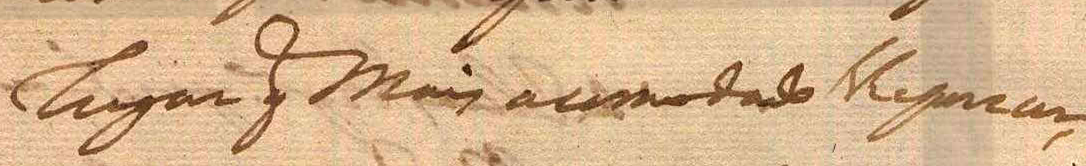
lugar q̄ mais acomodado lhe parecer,
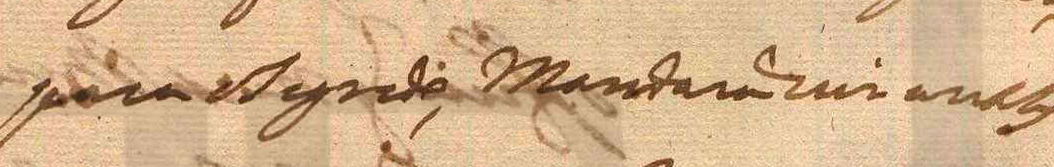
para o segredo, mandarā uir ante sy
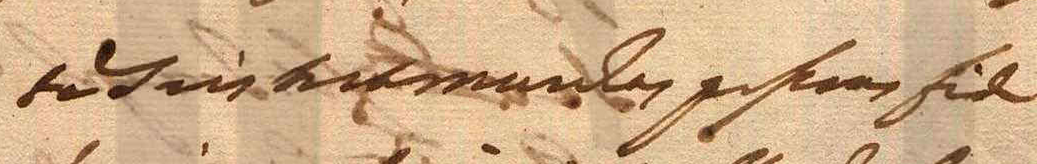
te seis tetemunhas pessoas fide
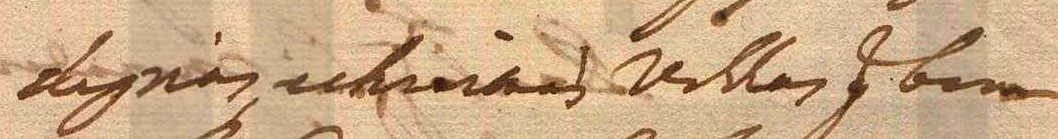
dignas, e christaās velhas q̄ bem
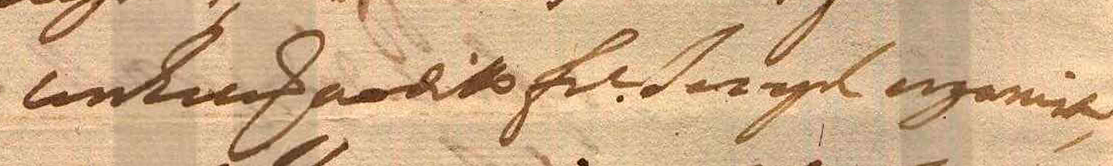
conheçaõ ao dito fr.e Iozeph organista,
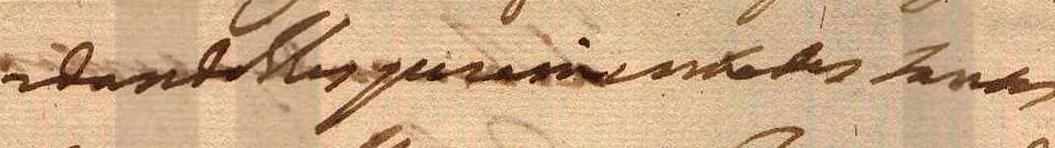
e dandolhes juramento dos santos
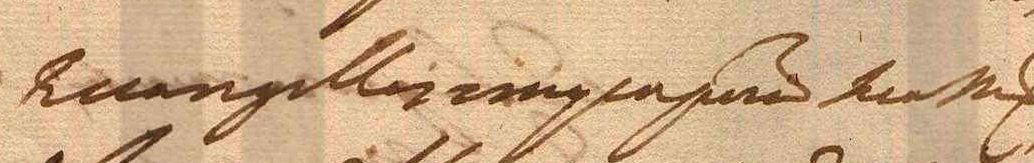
Euangelhos em que poraõ sua maõ
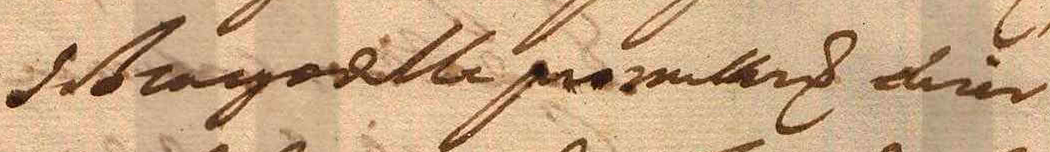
sob cargo delle prometteraõ dizer
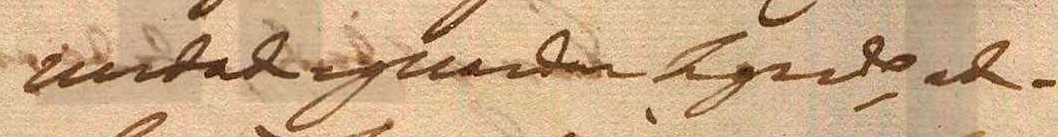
uerdade e guardar segredo, e de
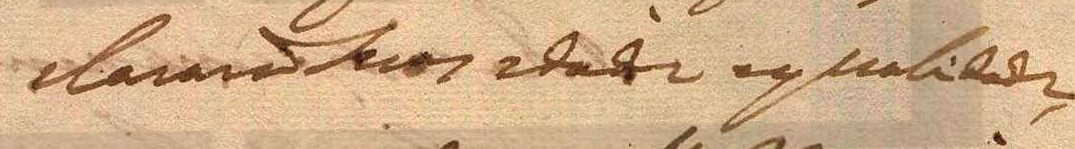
clararaõ suas idade e qualidade,
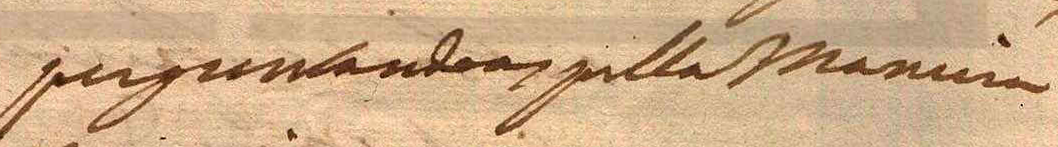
perguntandoas pella maneira
